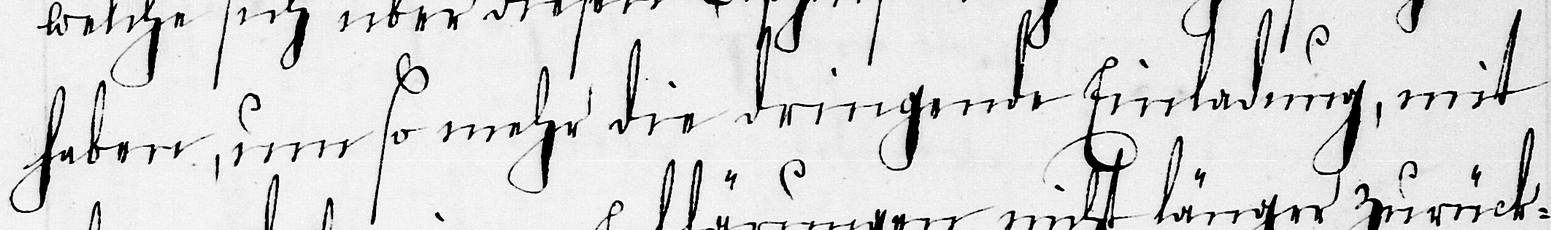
haben, um so mehr die dringende Einladung, mit
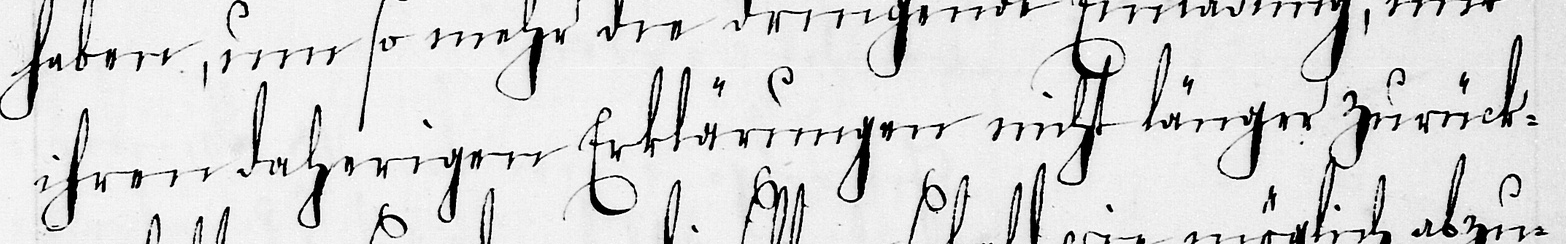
ihren daherigen Erklärungen nicht länger zurück¬
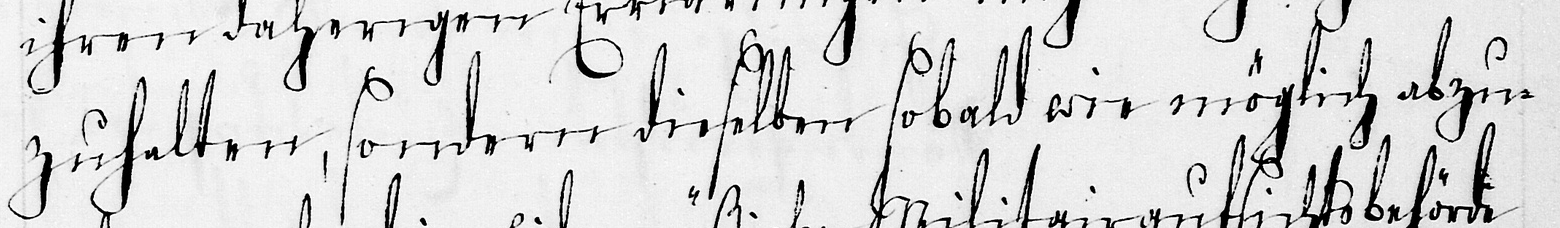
zuhalten, sondern dieselben sobald wie möglich abzu¬
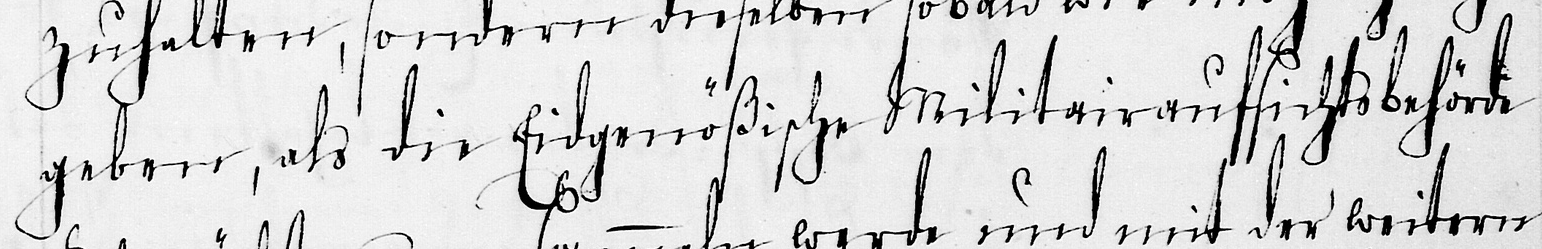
geben, als die Eidgenößische Militairaufsichtsbehörde
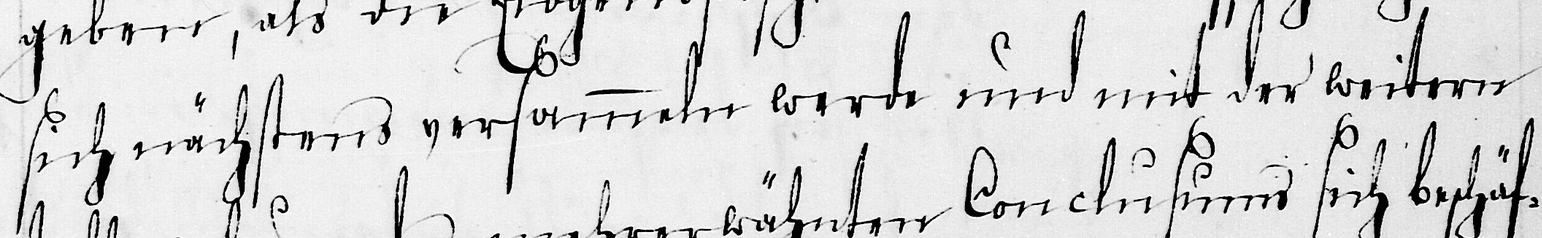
sich nächstens versammeln werde und mit der weitern
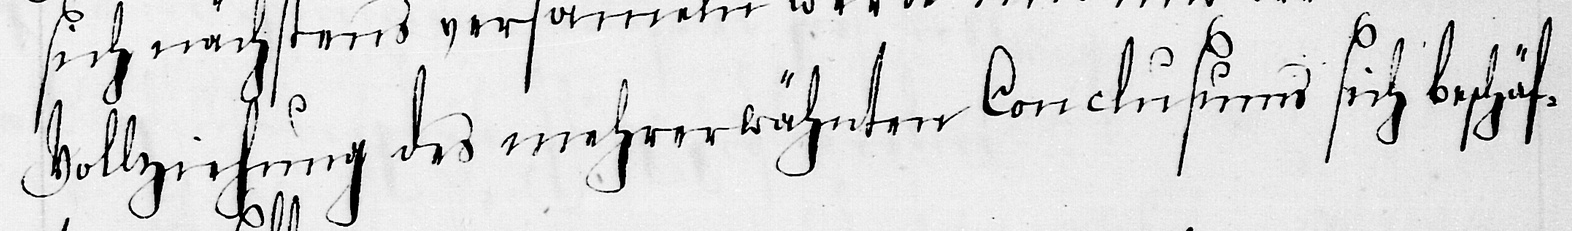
Vollziehung des mehrerwähnten Conclusums sich beschä¬
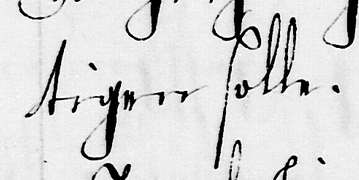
tigen soll¬
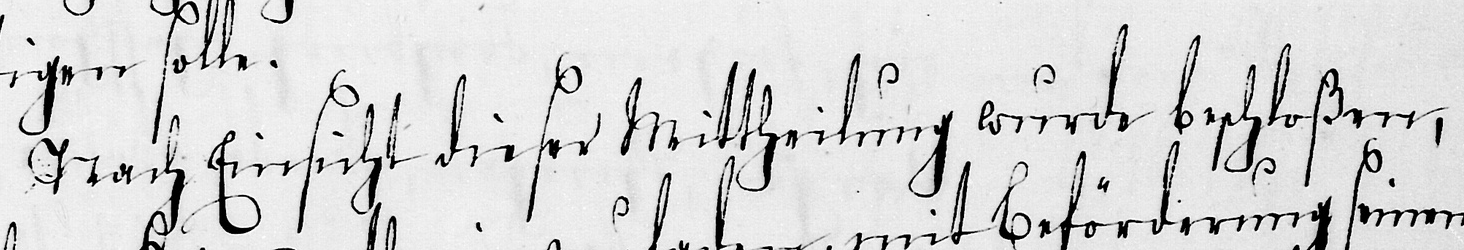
Nach Einsicht dieser Mittheilung wurde beschloßen,
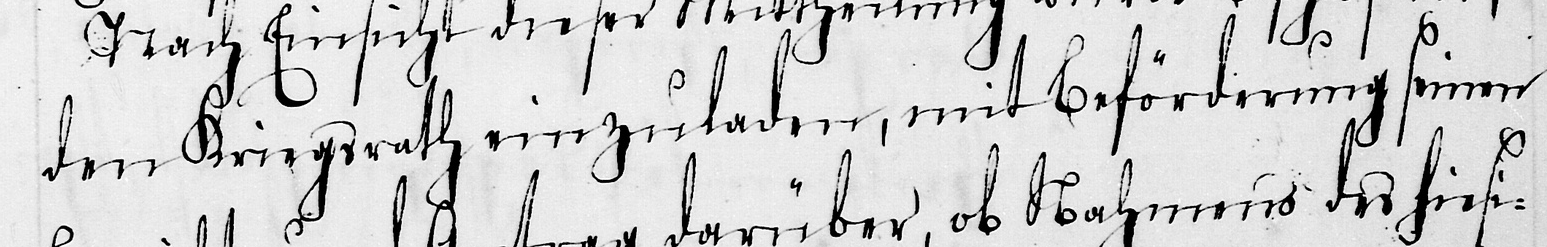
den Kriegsrath einzuladen, mit Beförderung seinen
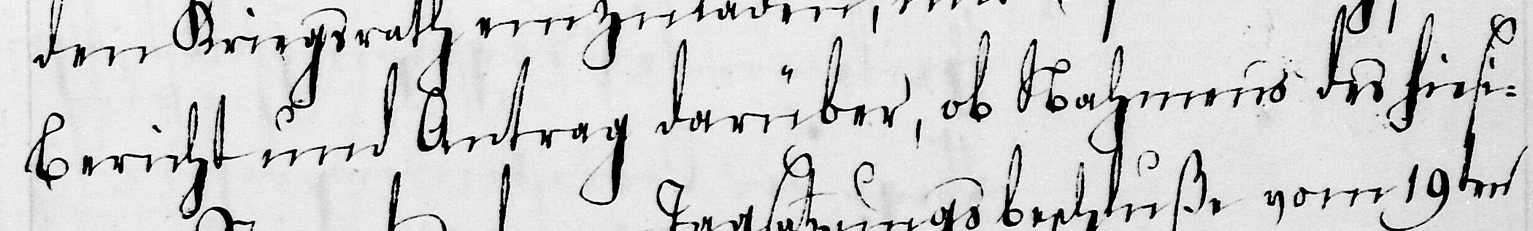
Bericht und Antrag darüber, ob Nahmens des hiesi¬
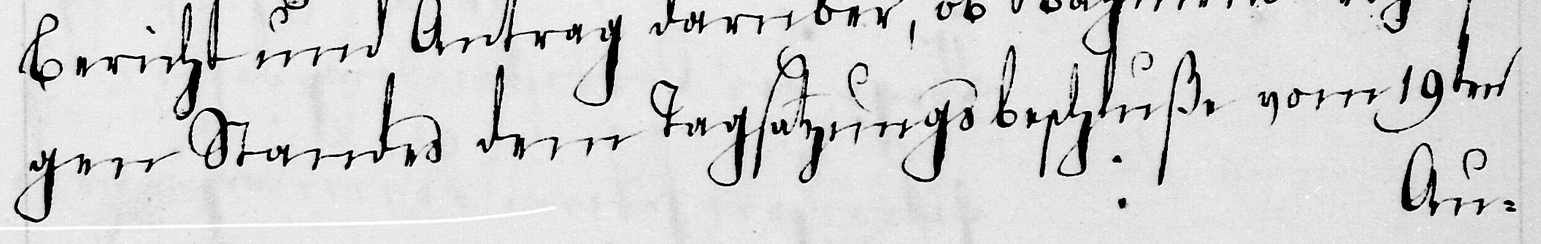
gen Standes dem Tagsatzungsbeschluße vom 19ten
